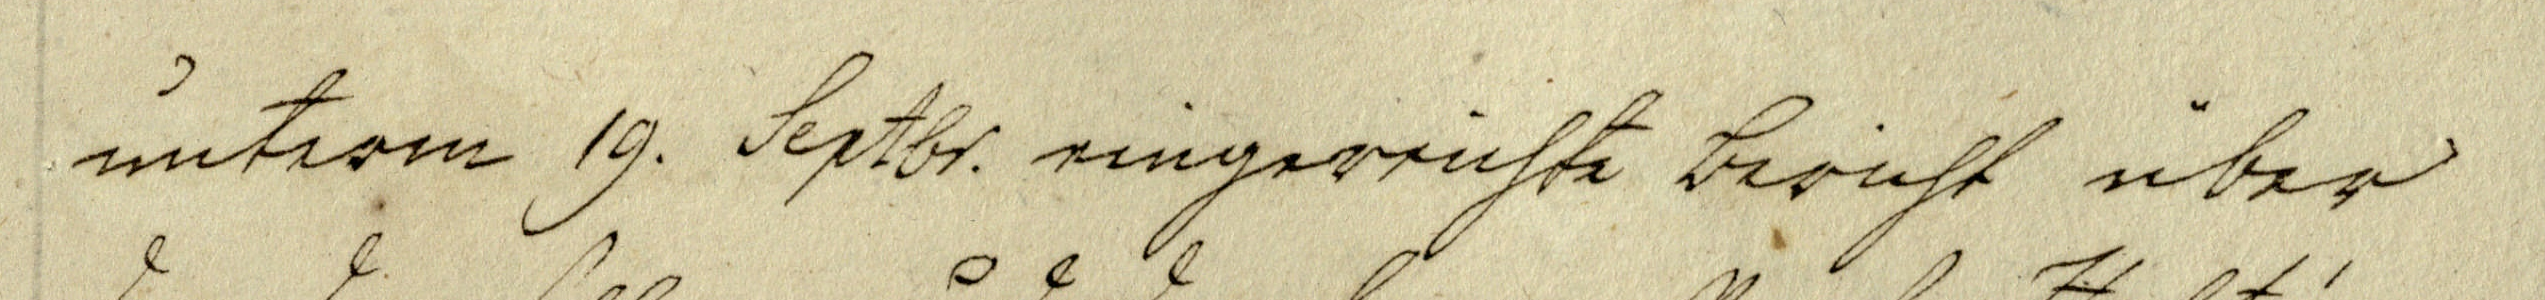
unterm 19. Septbr. eingereichte Bericht über
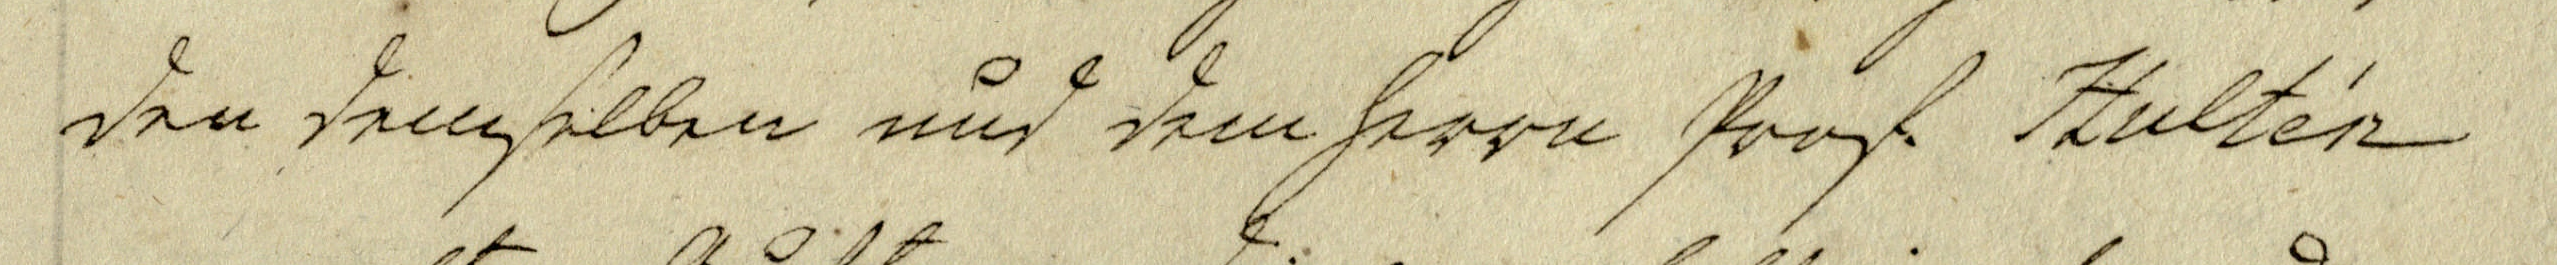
den demselben und dem Herrn Prof. Hultén
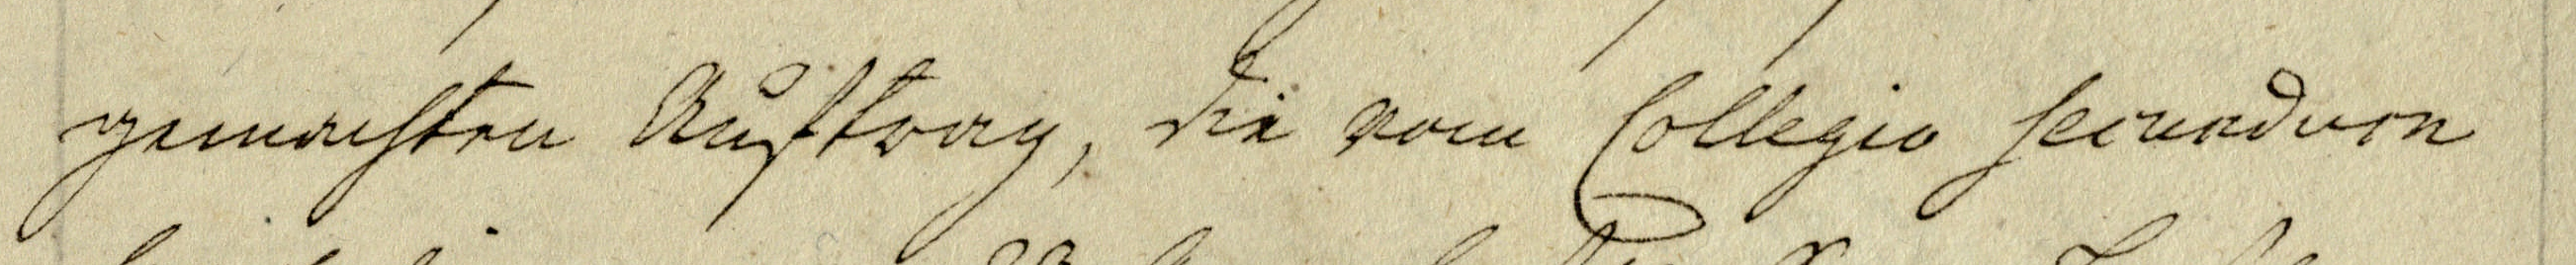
gemachten Auftrag, die vom Collegio secundum
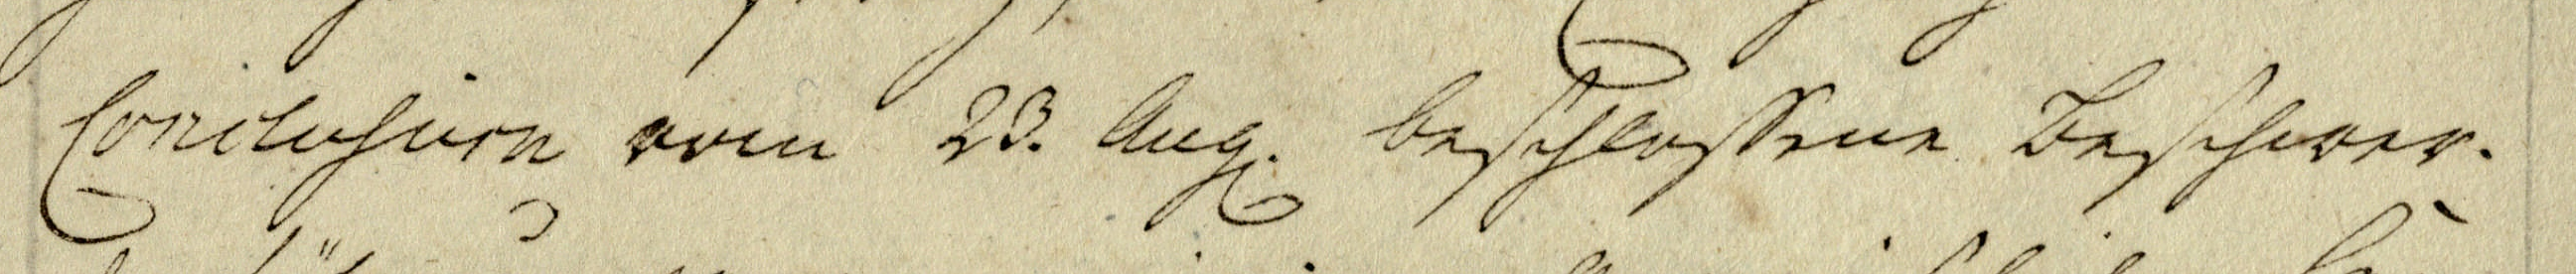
Conclusum vom 23. Aug. beschlossene Beschwer¬
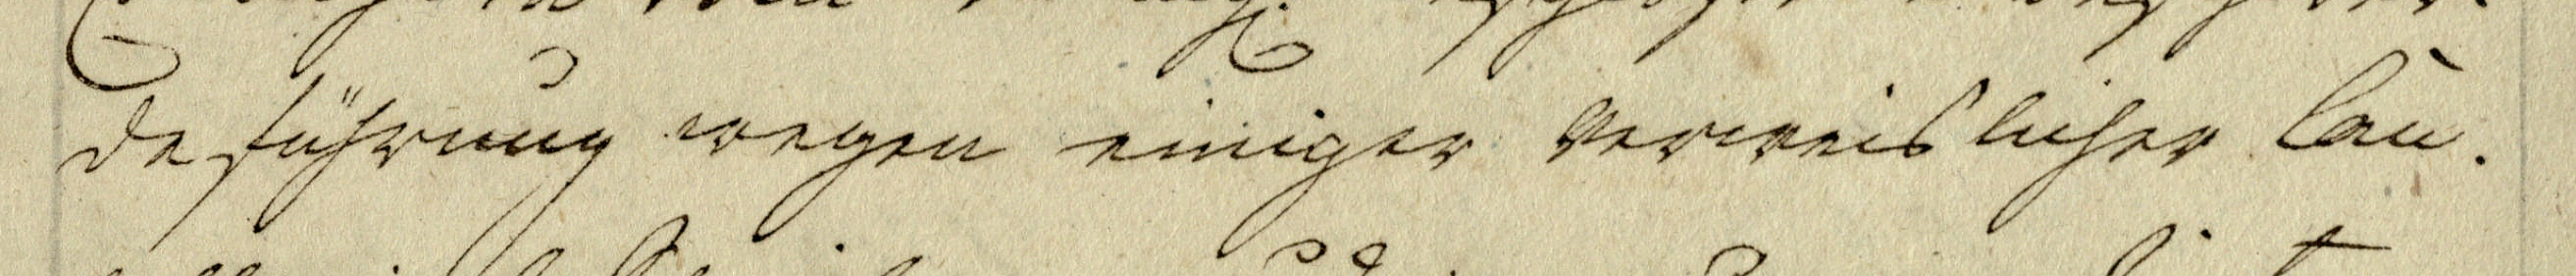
deführung wegen einiger verweislicher Can¬
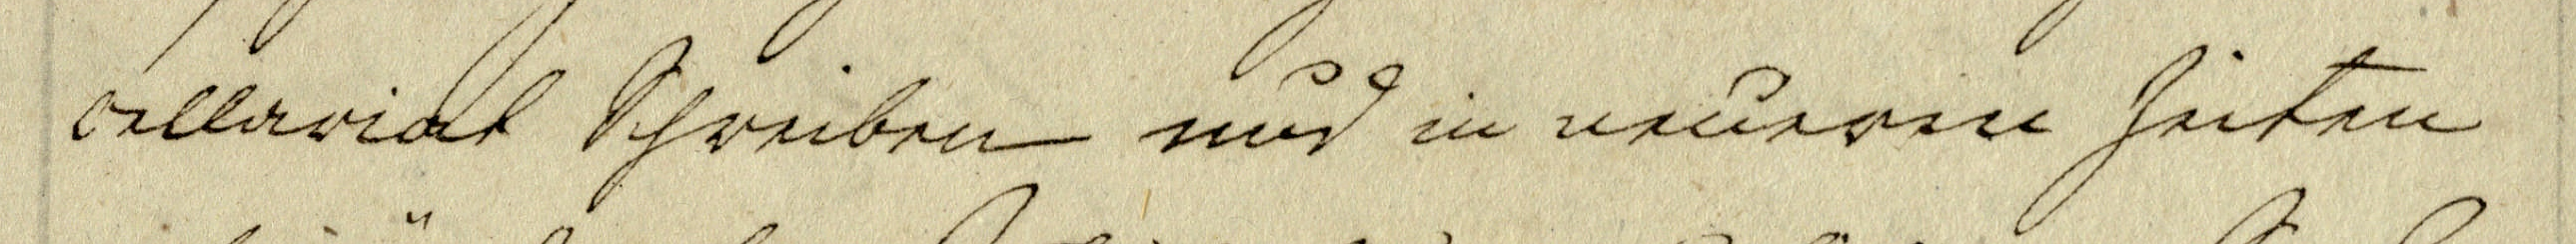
cellariat Schreiben und in neueren Zeiten
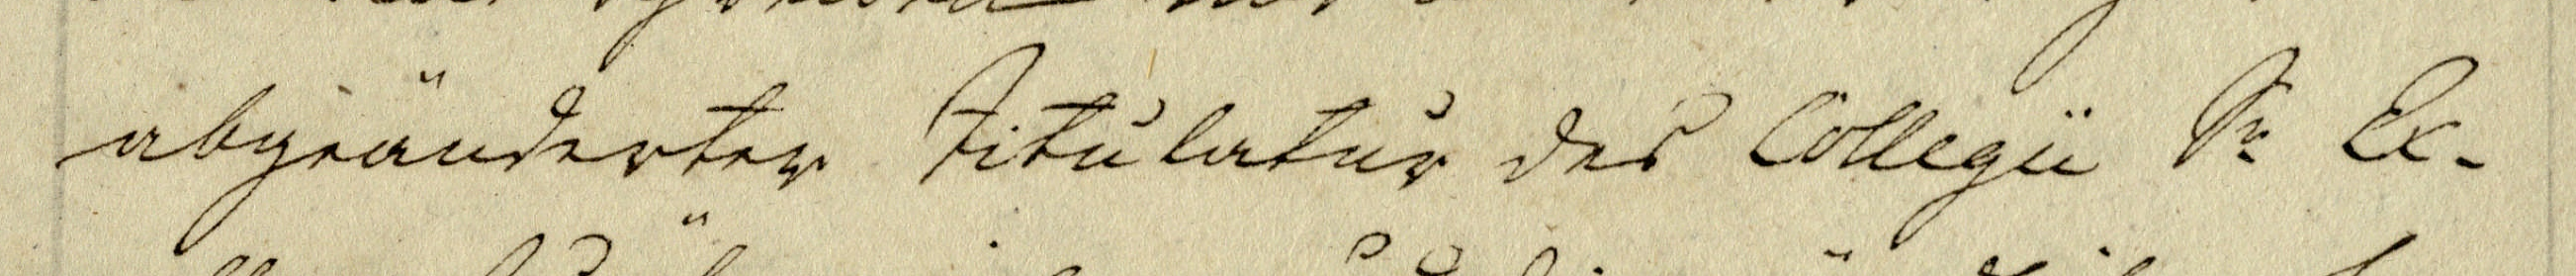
abgeänderter Titulatur des Collegii Sr Ex¬
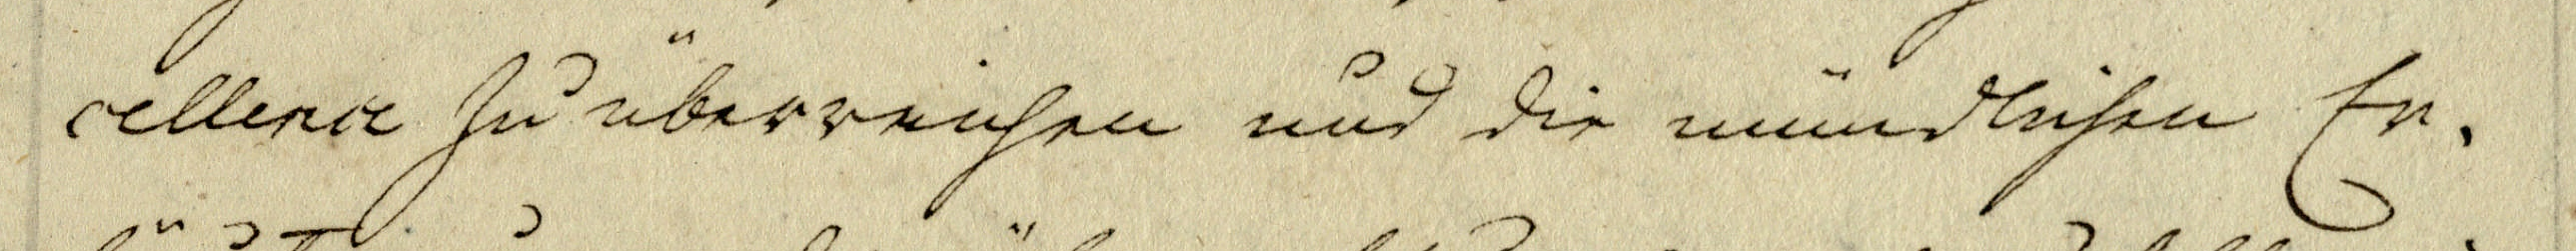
cellence zu überreichen und die mündlichen Er¬
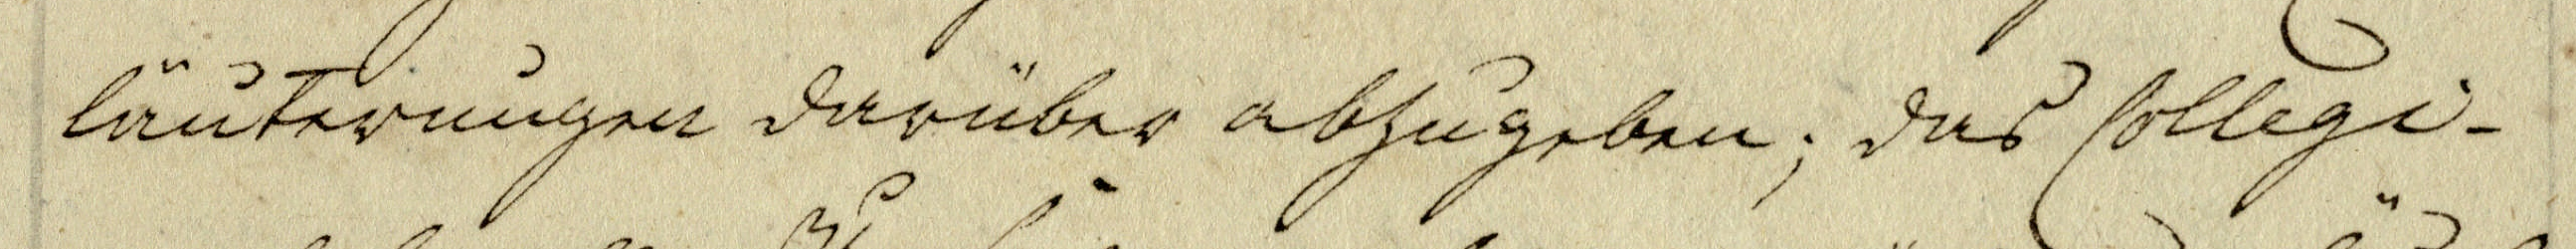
läuterungen darüber abzugeben; das Collegi¬
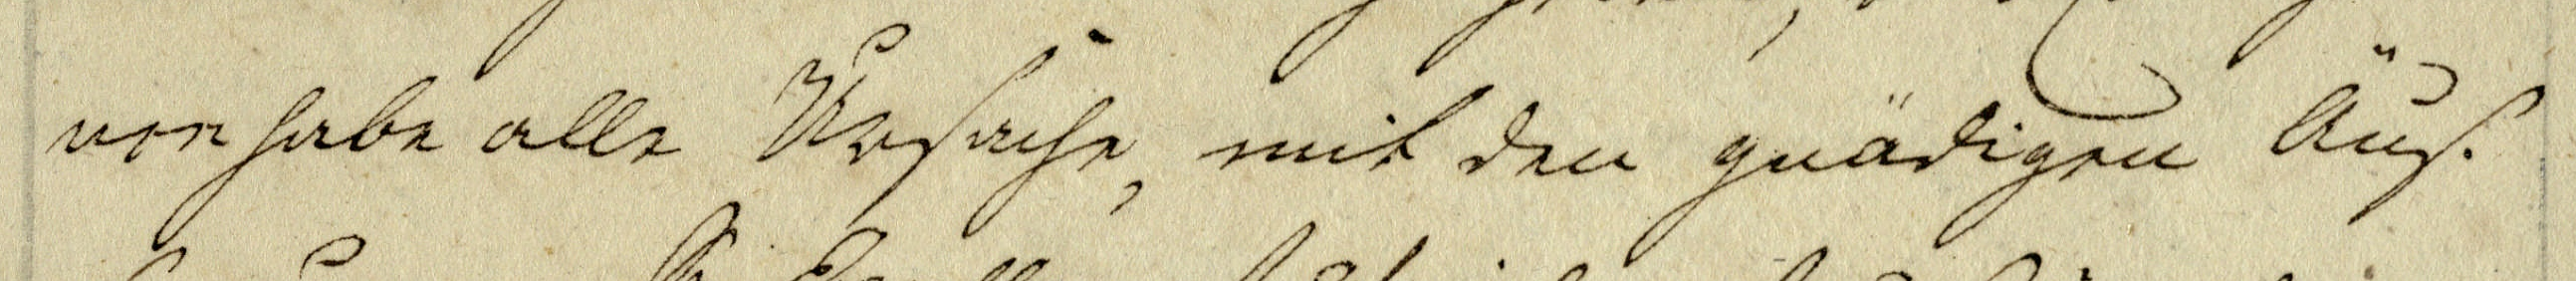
um habe alle Ursache, mit den gnädigen Äus¬
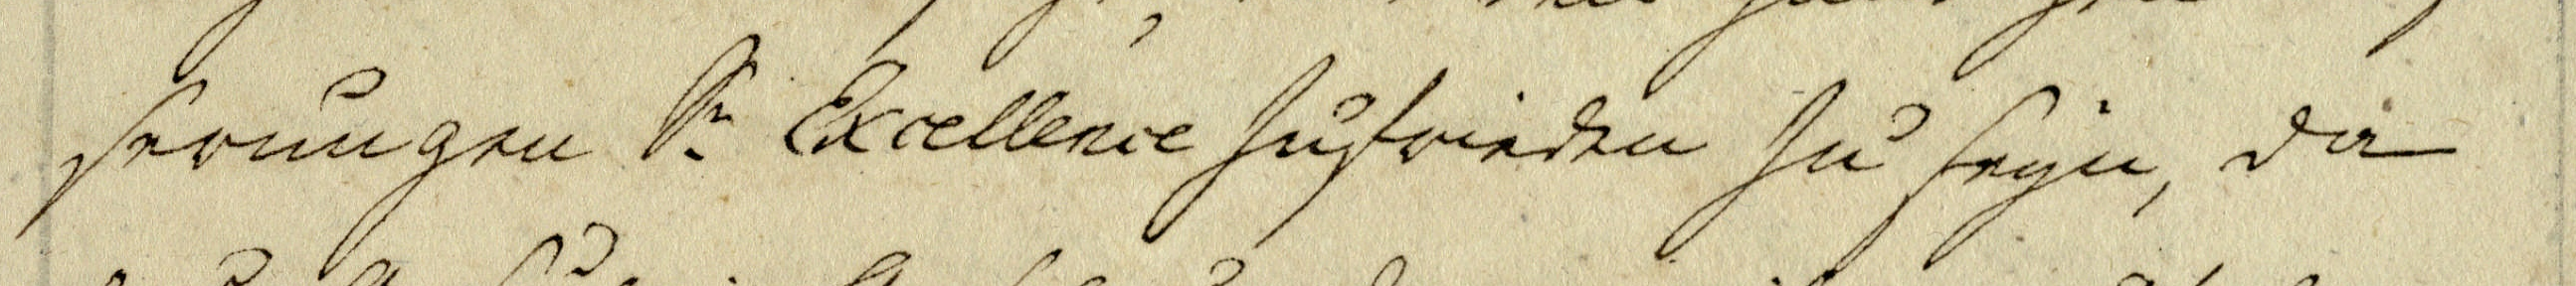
serungen Sr Excellence zufrieden zu seÿn, da
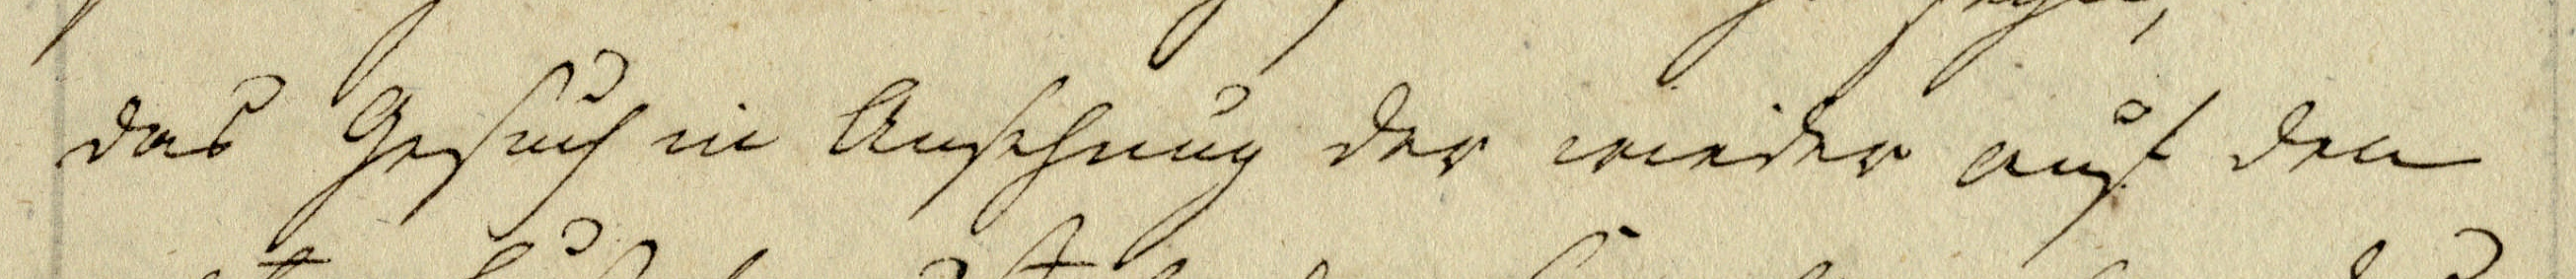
das Gesuch in Ansehung der wieder auf den
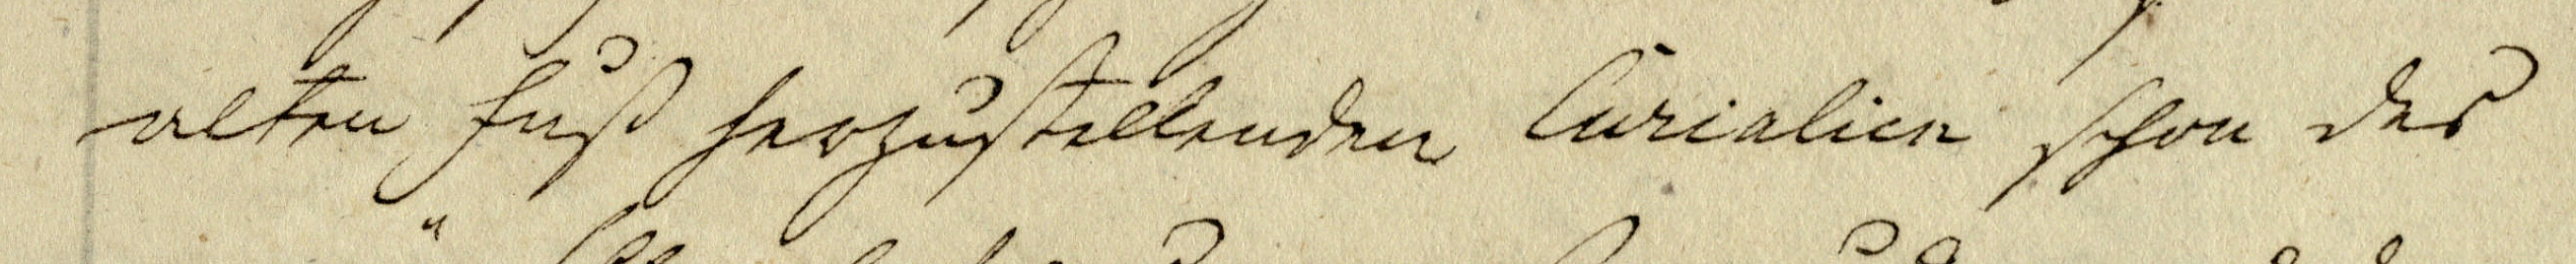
alten Fuß herzustellenden Curialien schon des
